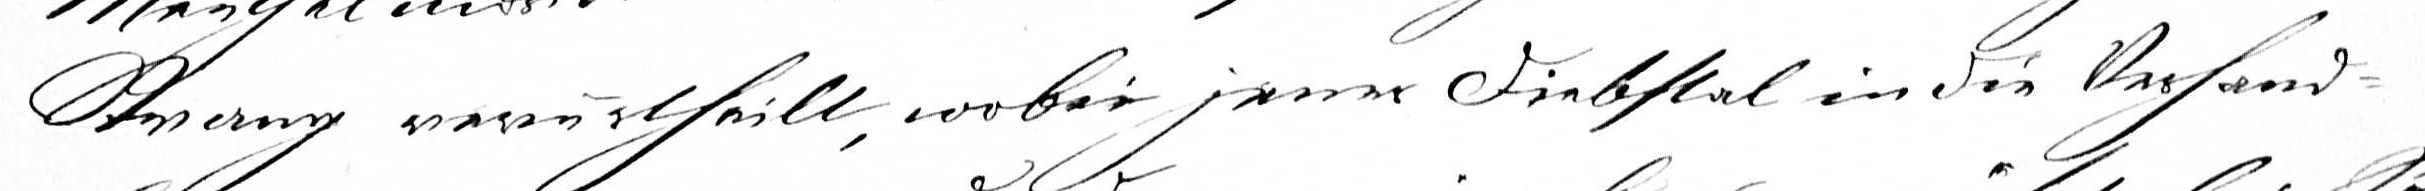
Strang verurtheilt, wobei jener Diebstal in die Verhand¬
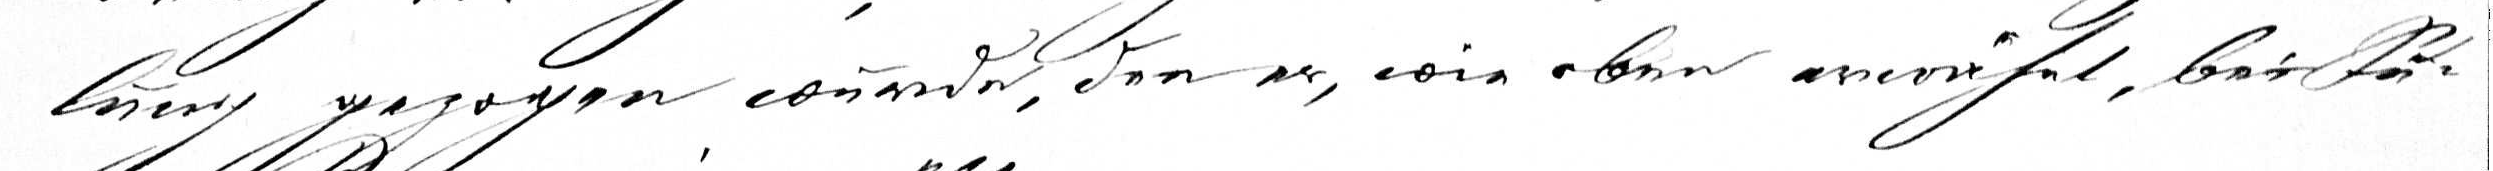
lung gezogen wurde, den er, wie oben erwähnt, bei Su
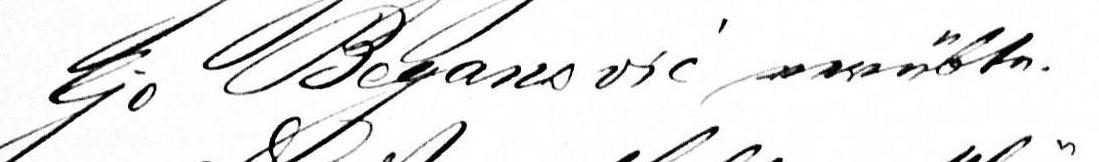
ljo Beganović verübte.
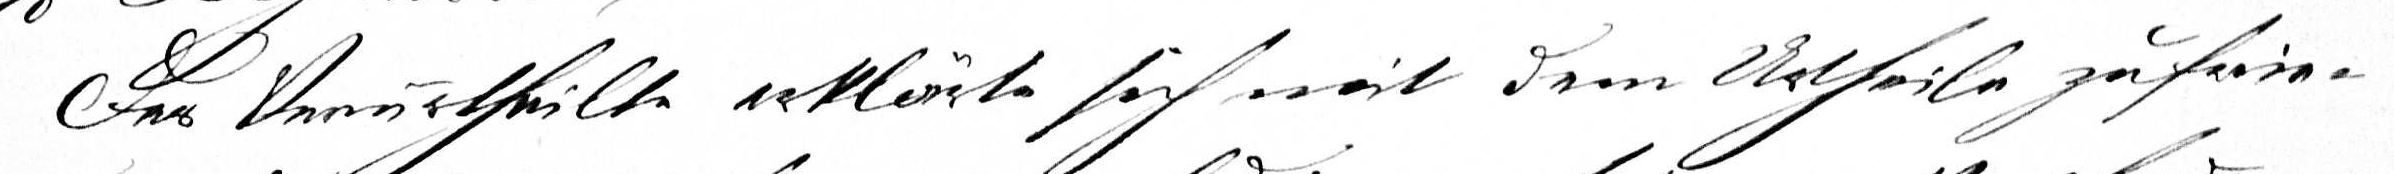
Der Verurtheilte erklärte sich mit dem Urtheile zufrie¬
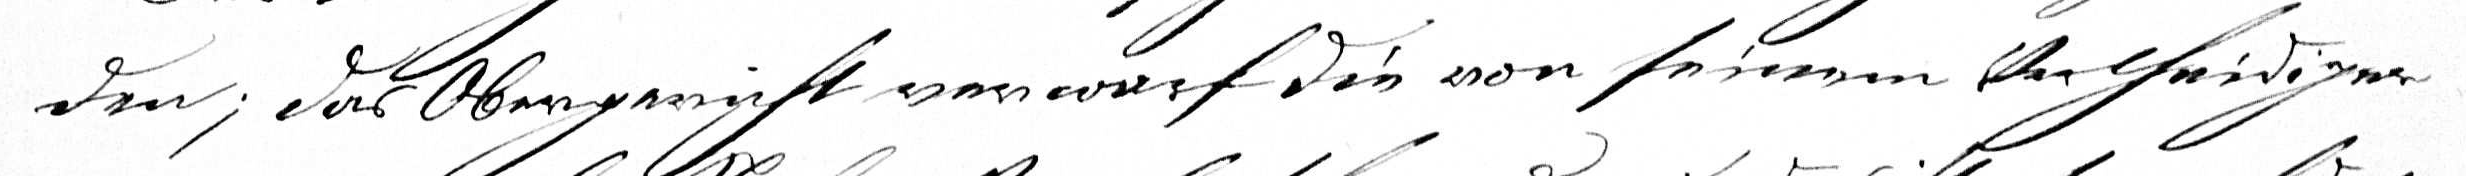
den; das Obergericht verwarf die von seinem Vertheidiger
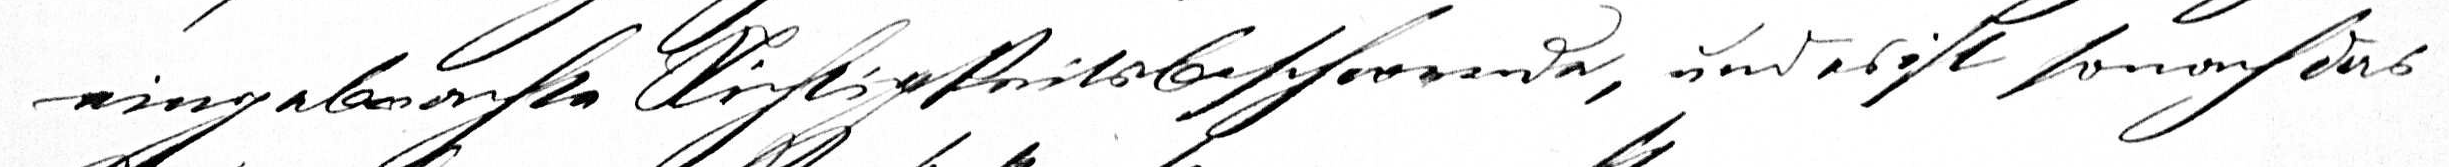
eingebrachte Nichtigkeitsbeschwerde, und es ist sonach das
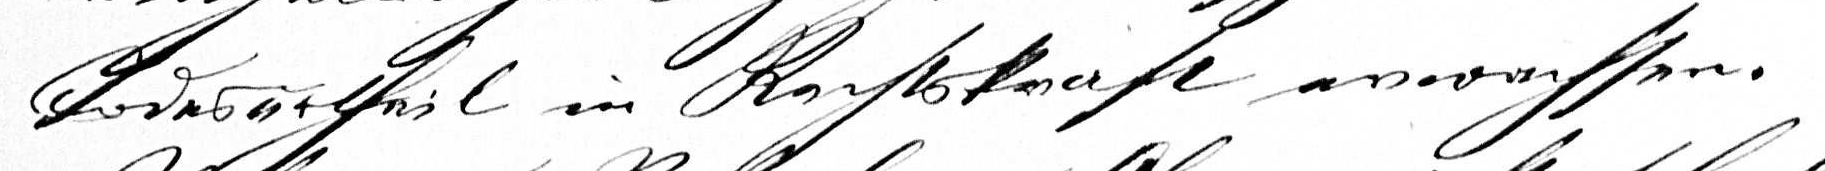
Todesurtheil in Rechtskraft erwachsen.
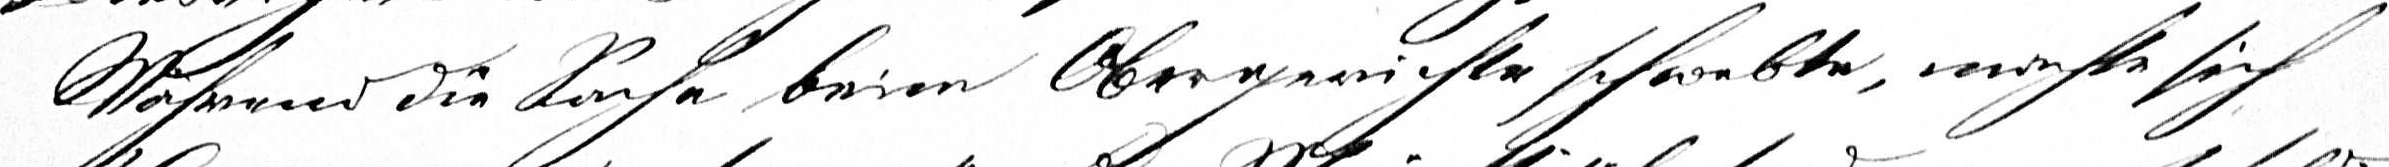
Während die Sache beim Obergerichte schwebte, machte sich
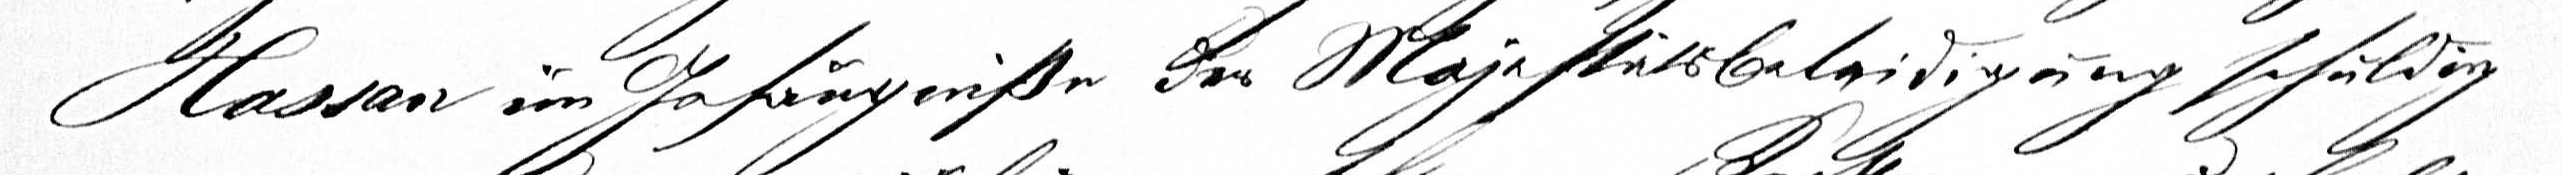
Hassan im Gefängniße der Majestätsbeleidigung schuldig
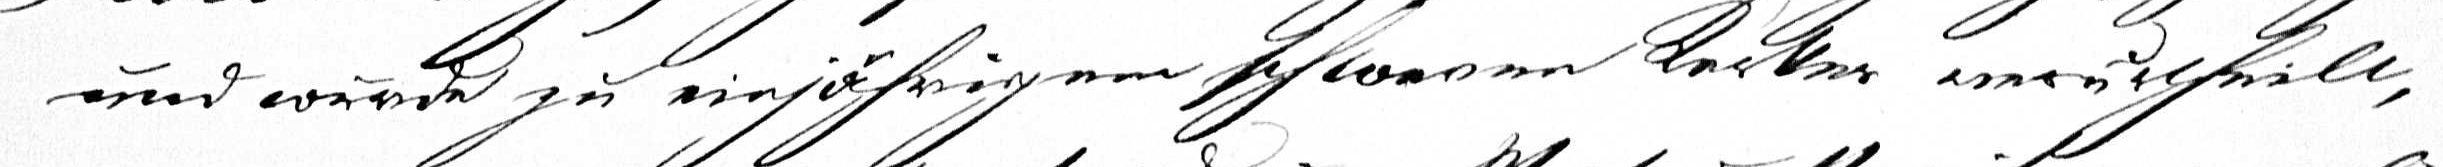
und wurde zu einjährigem schweren Kerker verurtheilt,
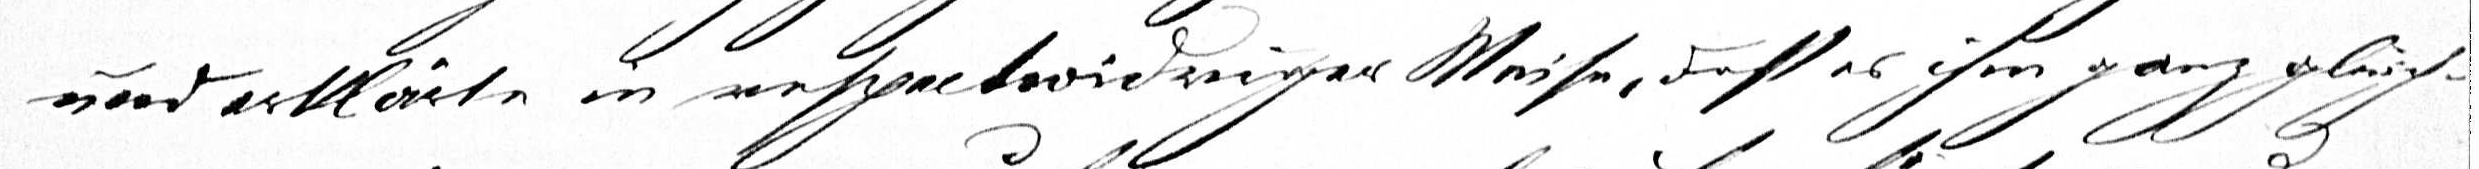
und erklärte in respectwidriger Weise, daß es ihm ganz gleich¬
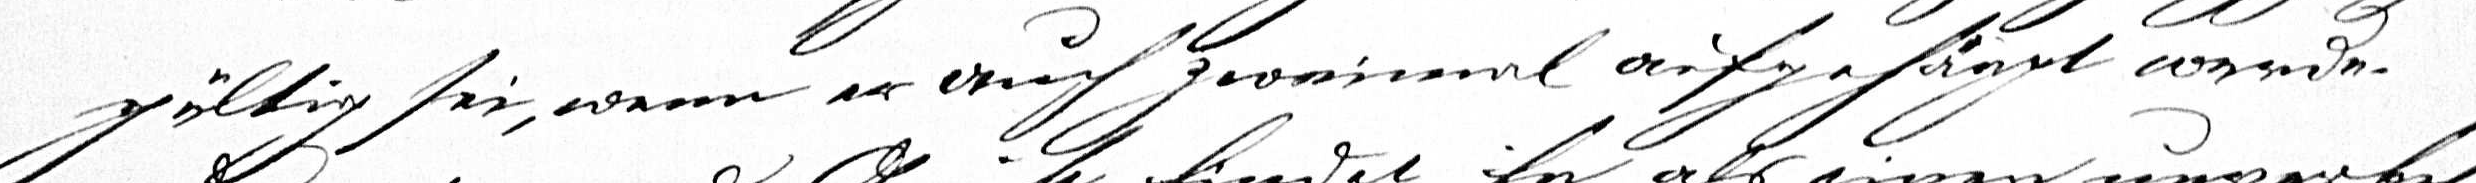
gültig sei, wenn er auch zweimal aufgehängt werde.
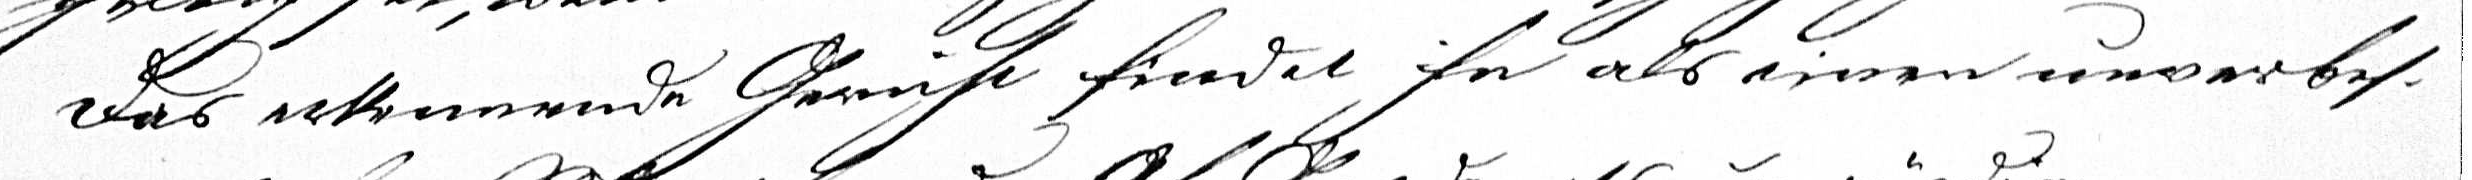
Das erkennende Gericht findet ihn als einen unverbes¬
